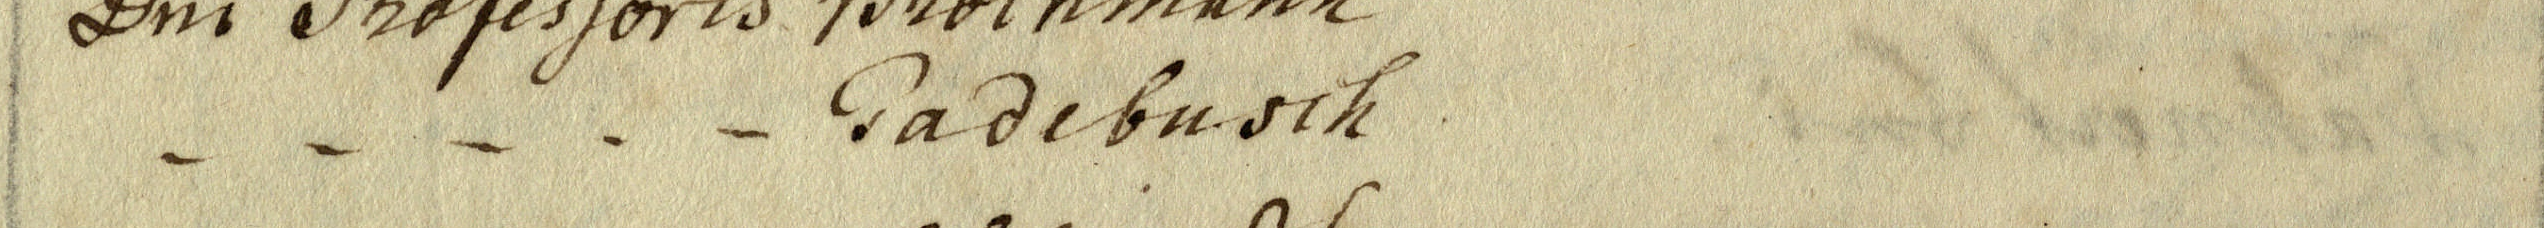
Gadebusch.
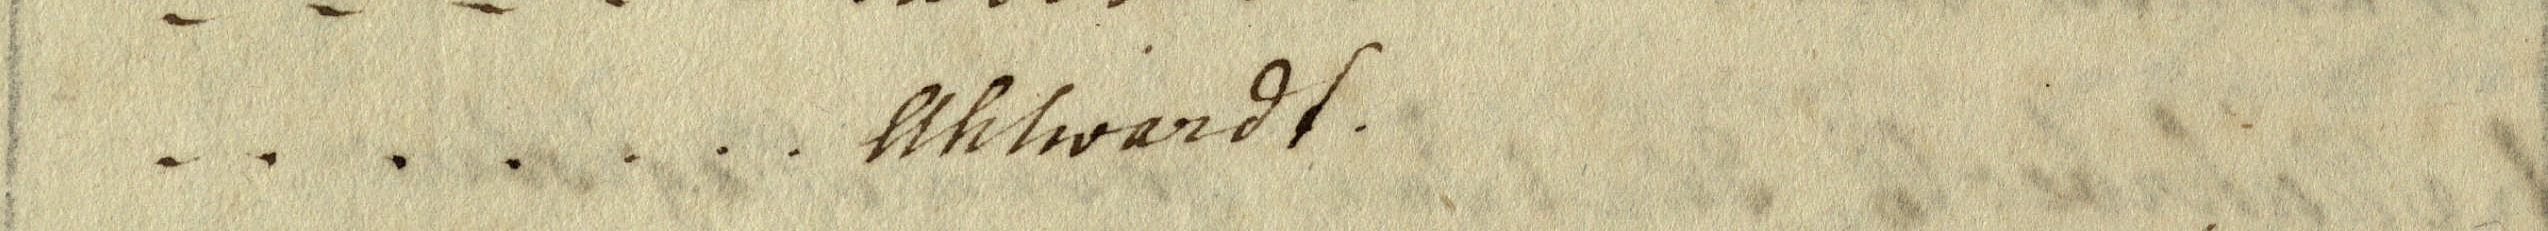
Ahlwardt.
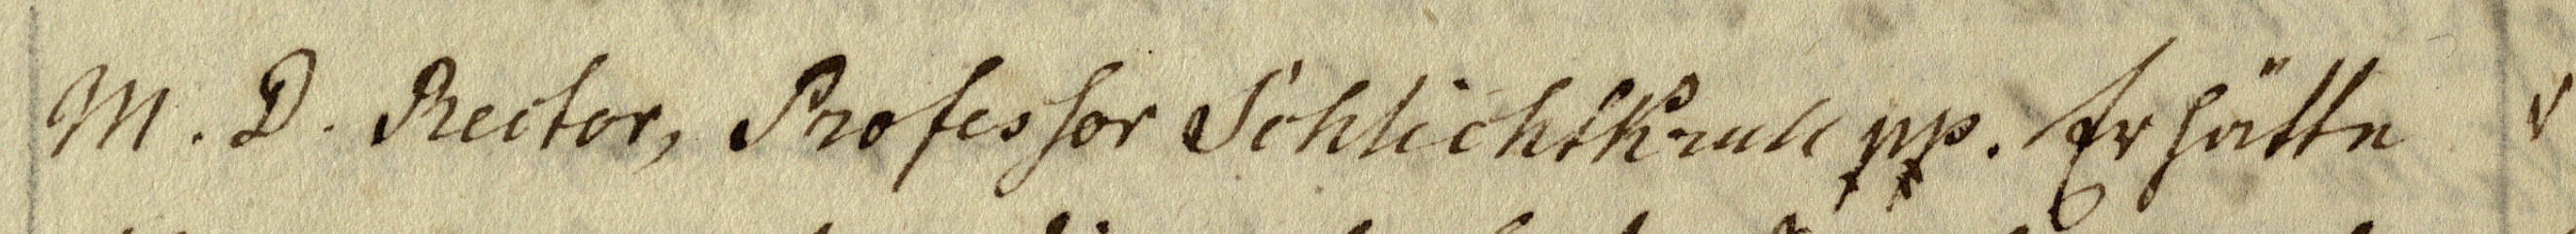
M. D. Rector, Professor Schlichtkrull pp. Er hätte
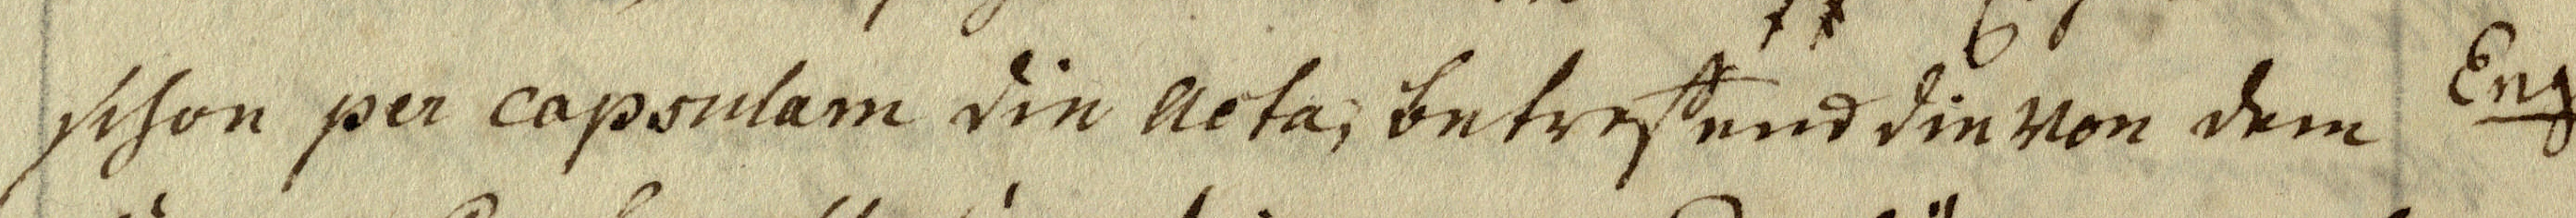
schon per capsulam die Acta, betreffend die von dem
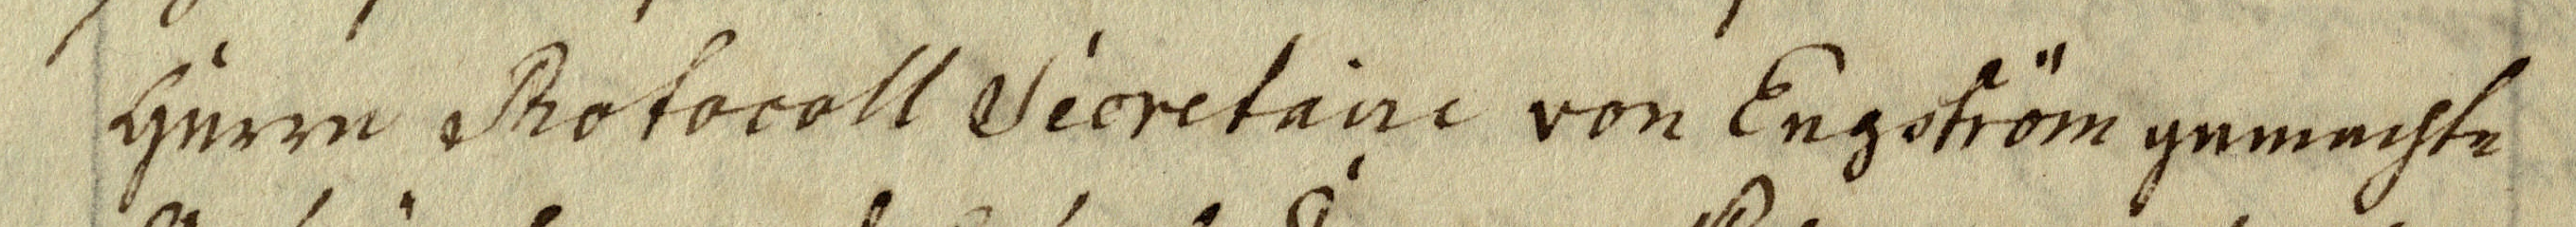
Herrn Protocoll Secretaire von Engström gemachte
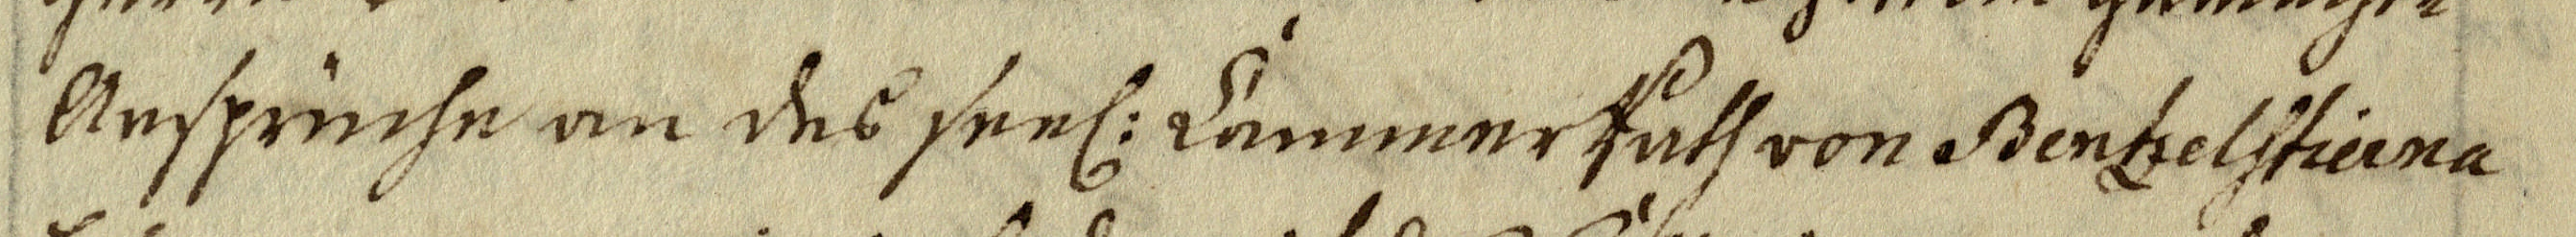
Ansprüche an des seel. CammerRath von Bentzelstierna
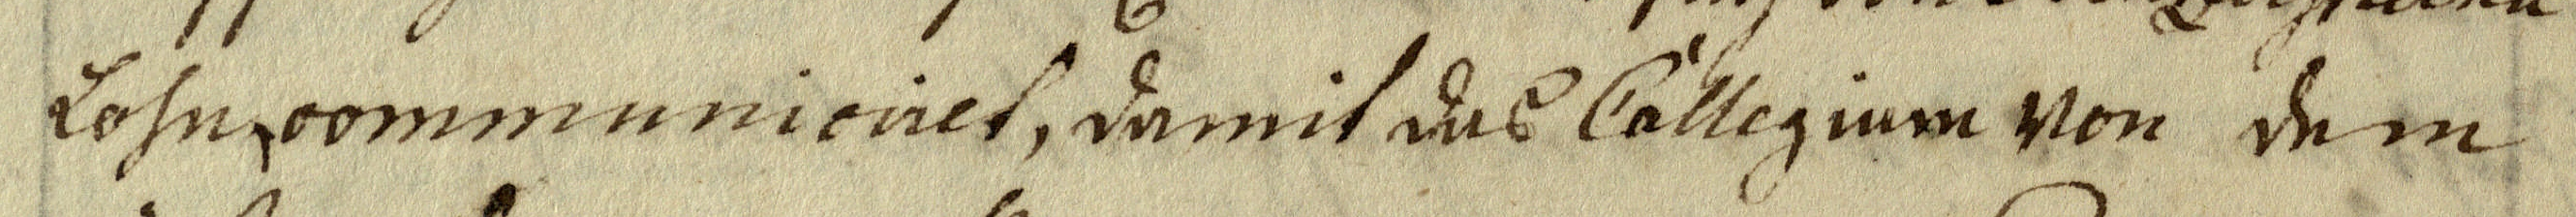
Lohn communiciret, damit das Collegium von dem
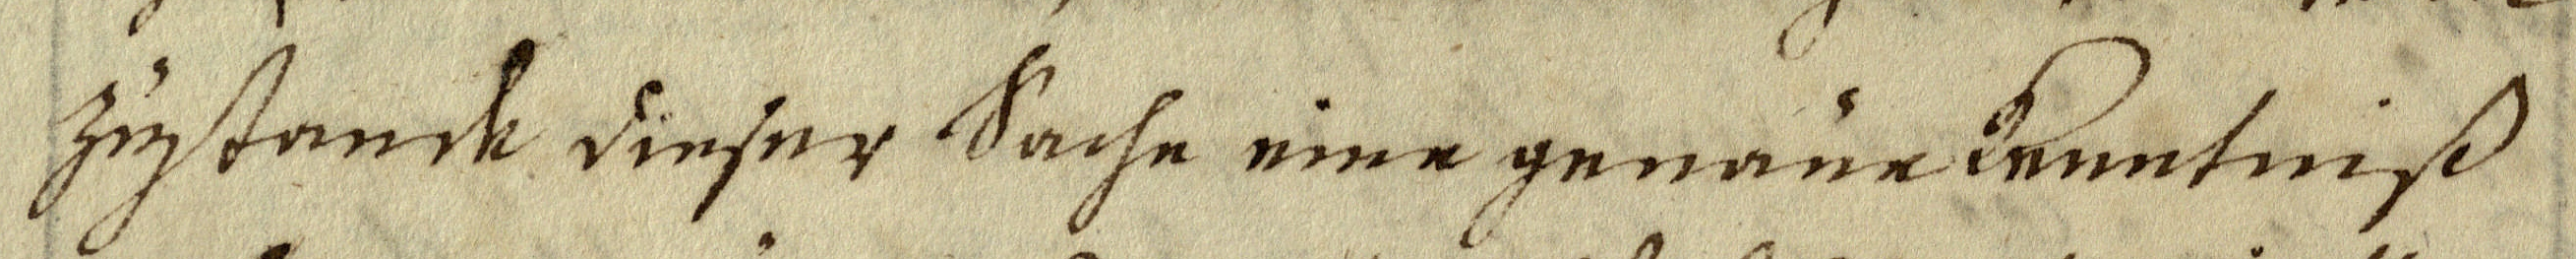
Zustande dieser Sache eine genaue Kenntniß
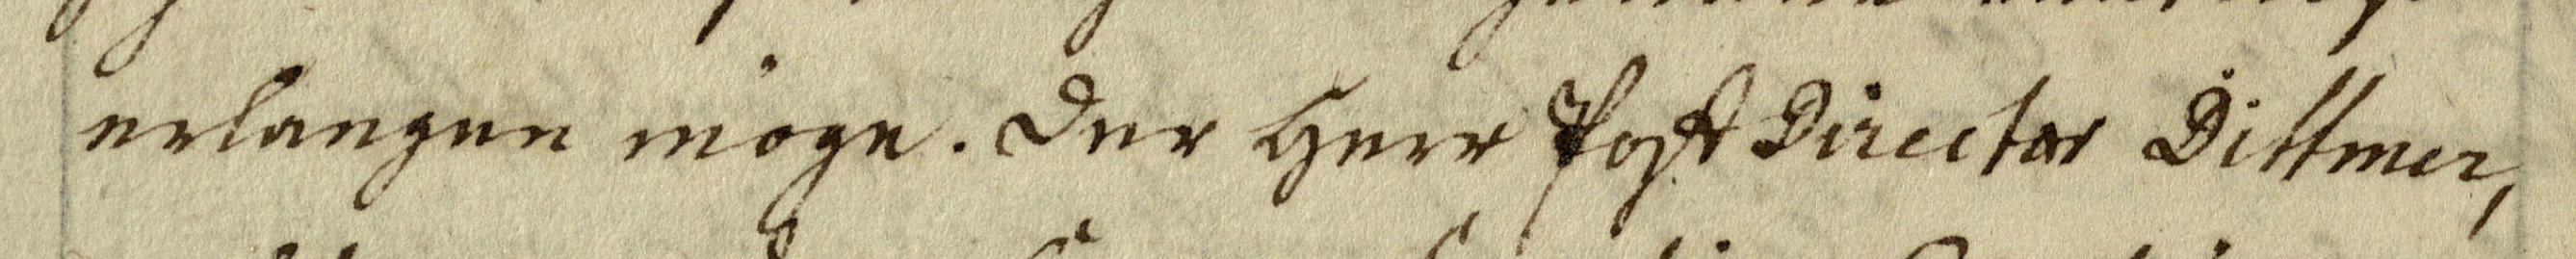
erlangen möge. Der Herr Post Director Dittmer,
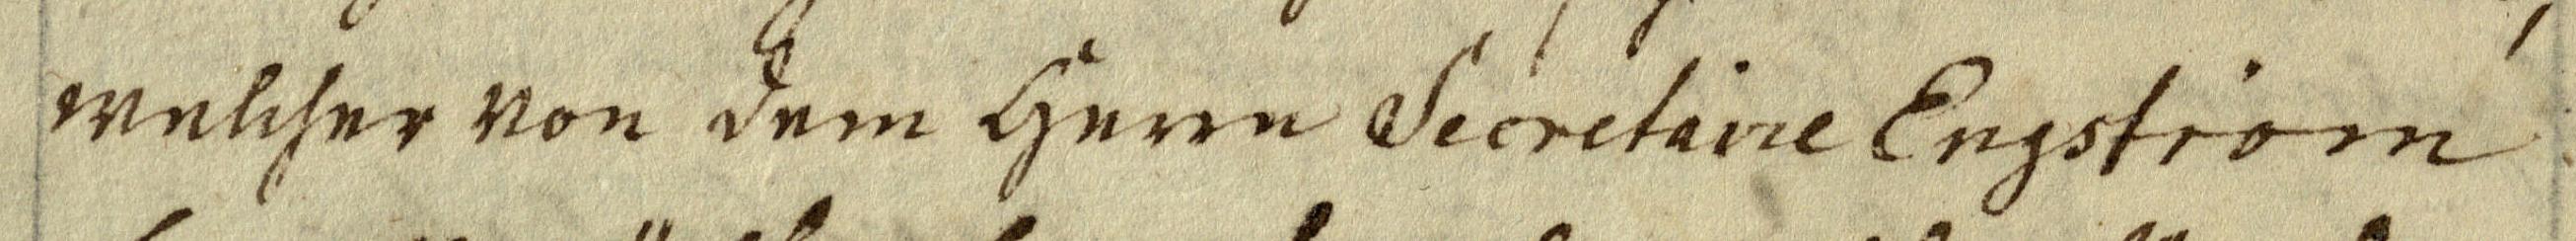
welcher von dem Herrn Secretaire Engström
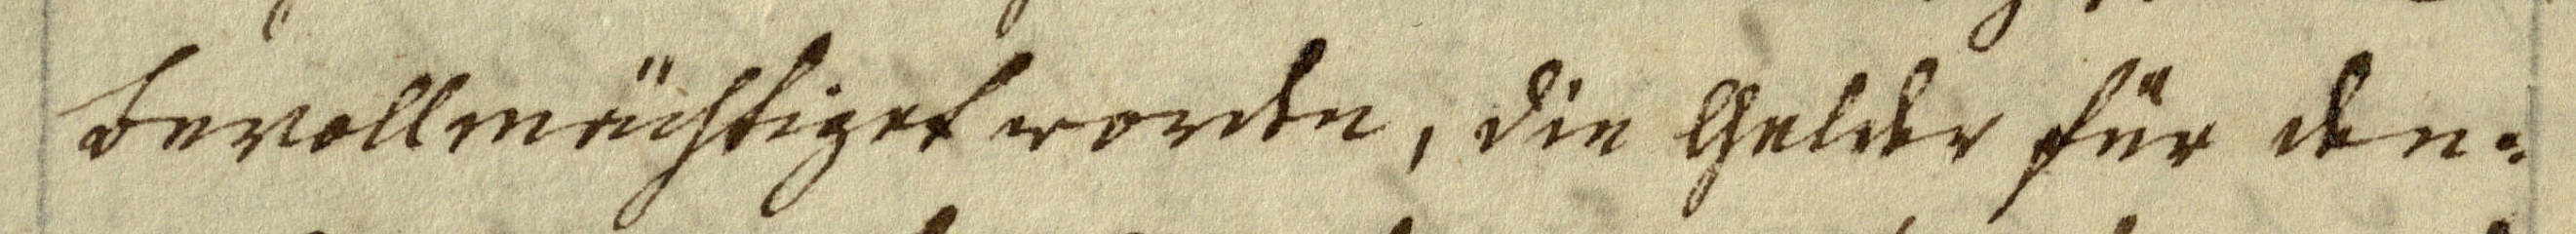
bevollmächtiget worden, die Gelder für den¬
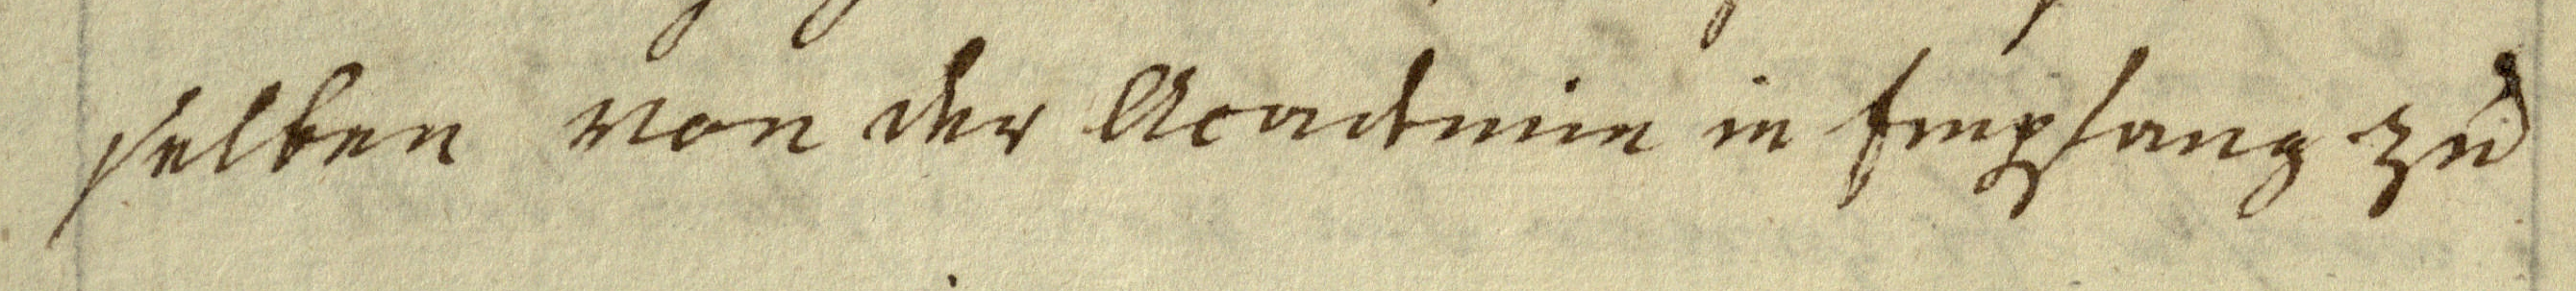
selben von der Academie in Empfang zu
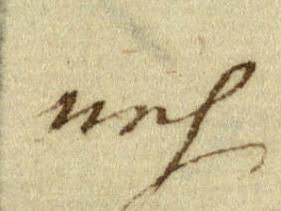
neh
